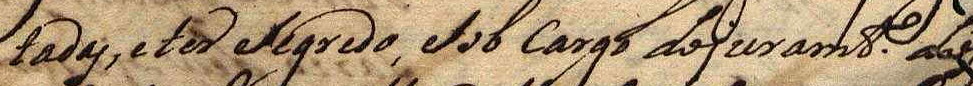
tadas, e ter Segredo, Sob cargo do juram.to dos
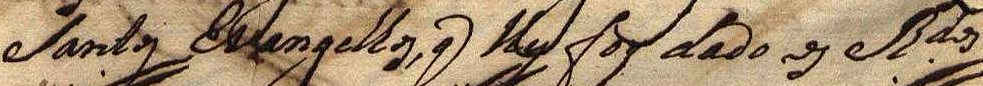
Santos Evangelhos, q̄ lhes foy dado os R.dos
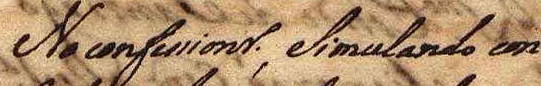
No confessionr.o, Simulando con
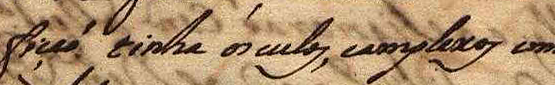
fiçaõ tinha osculos, e amplexos com
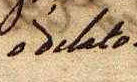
o delato.
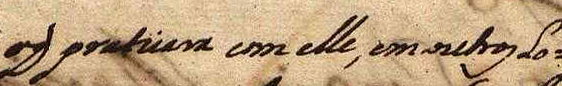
o q̄ praticava com elle, em outros Lo=
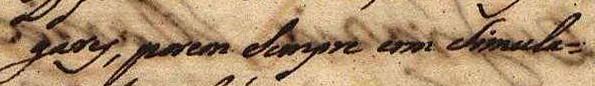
gares, porem Sempre em Simula=
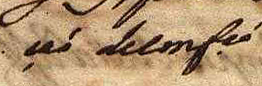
çaõ de conf.ãoeo
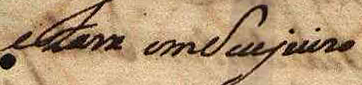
estava em Seu juizo
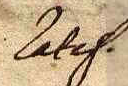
Ratef.
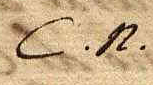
C. n.
